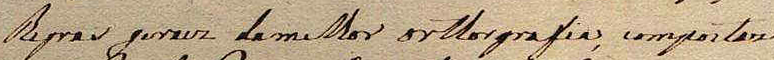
Regras geraez da melhor orthografia, compostaz
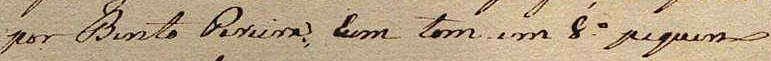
por Bento Pereira, hum tom em 8o. pequen
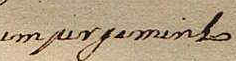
em pergaminho
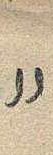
11
